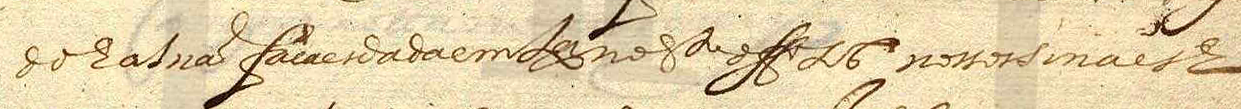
do E al naõ façaes dada em Lxa no sto offo sob nossos sinaes E
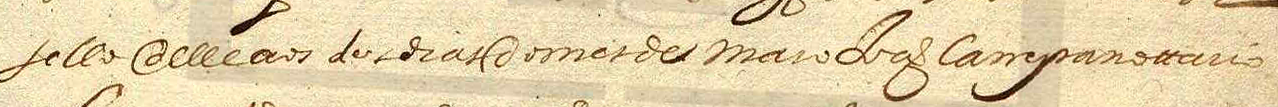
sello delle aos dez dias do mes de maio Ioaõ Carreyra nottario
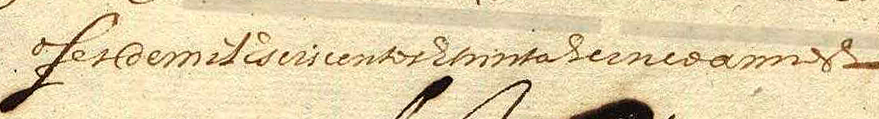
o fes de mil E seiscentos E trinta E cinco annos
